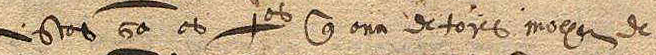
estas s̄a as tas q̄ ana de tores molher de
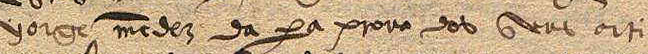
yorge m̄edez da ꝑa proua dos seus arti
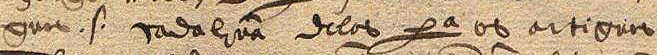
guos .s. cada hūa delas ꝑa os artiguos
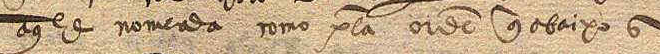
a q̄ he nomeada como p̄la ord̄e q̄ abaixo se
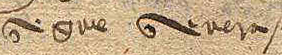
segue se uera /.
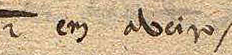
item em aveiro /
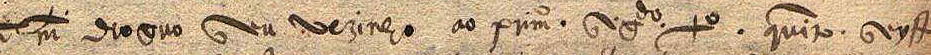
item mte dioguo seu vezinho ao primo . segdo . to . q̄uito . seysto
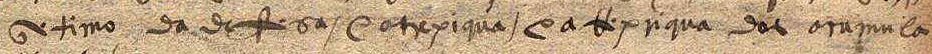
setimo da defesa / e a trepiqua / e a Repriqua dos acumula
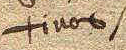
tiuos /
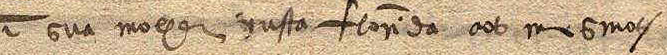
item sua molher yusta flor̄ida aos mesmos/
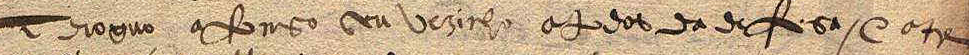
item dioguo afomso seu vezinho a todos da defesa / e a tre
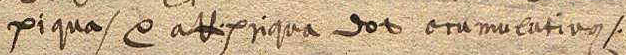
piqua / e a Repriqua dos acumulatiuoꝯ /.
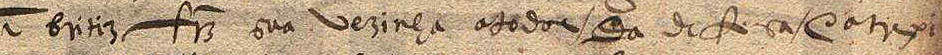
item britiz fr̄z sua vezinha a todos / da defesa/ e a trepi
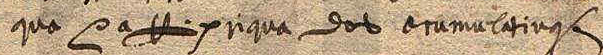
qua e a Repriqua dos acumulatiuꝯ/
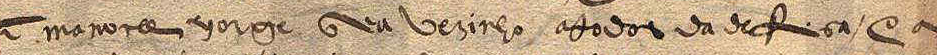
item manoell yorge seu vezinho a todos da defesa / e a
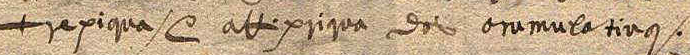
trepiqua/ e a Repriqua dos acumulatiuꝯ /.
